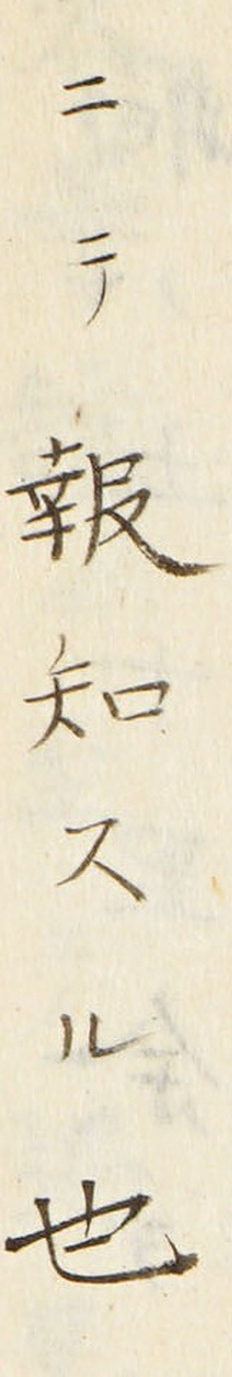ニテ報知スル也

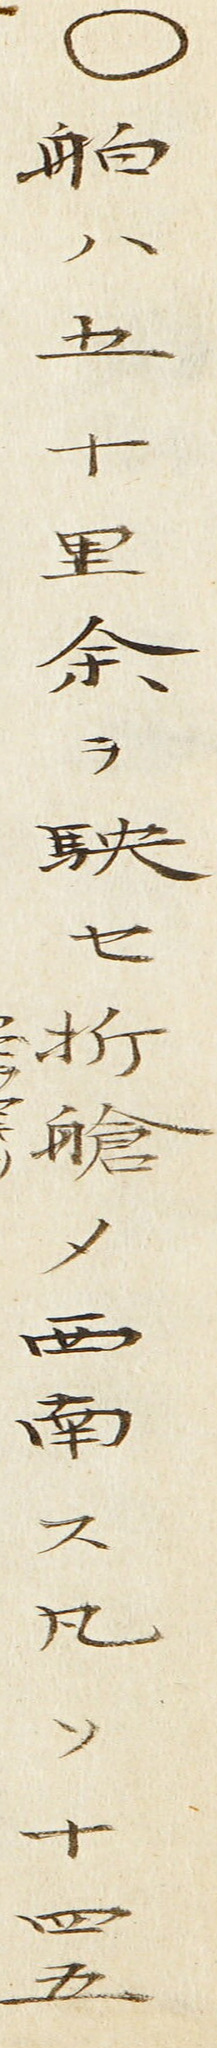○舶ハ五十里余ヲ駚セ折艙シテ西南ス凡ソ十四五
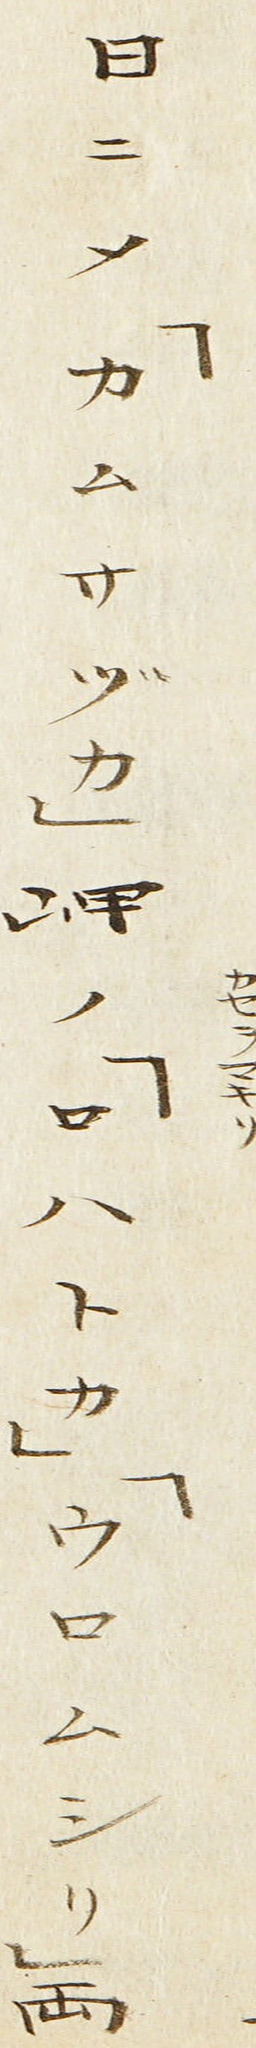日ニシテ「カムサヅカ」岬ノ「ロハトカ」「ウロムシリ」両
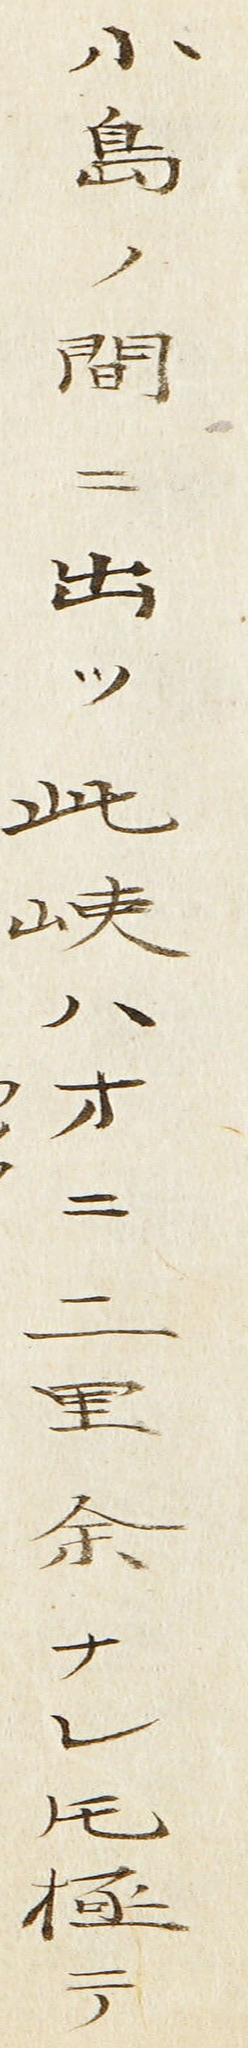小島ノ間ニ出ツ此ハオニ二里余ナレトモ極テ
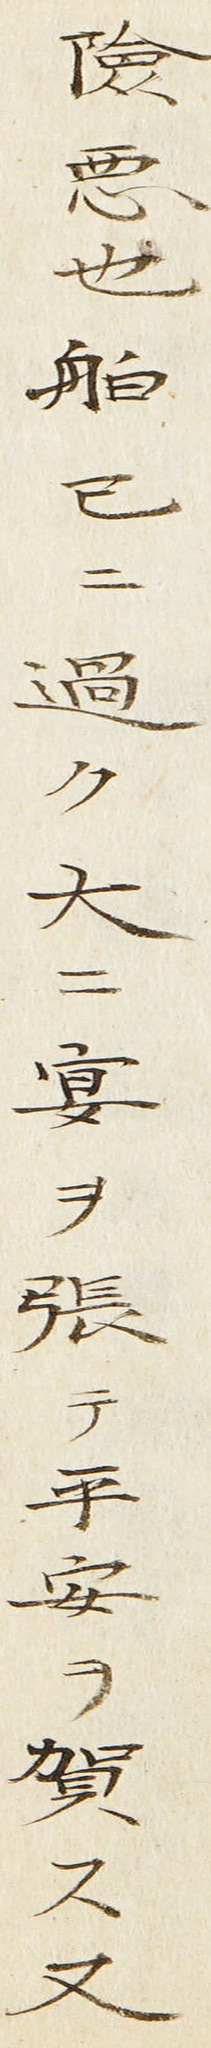険悪也船已ニ過ク大ニ宴ヲ張テ平安ヲ賀ス又
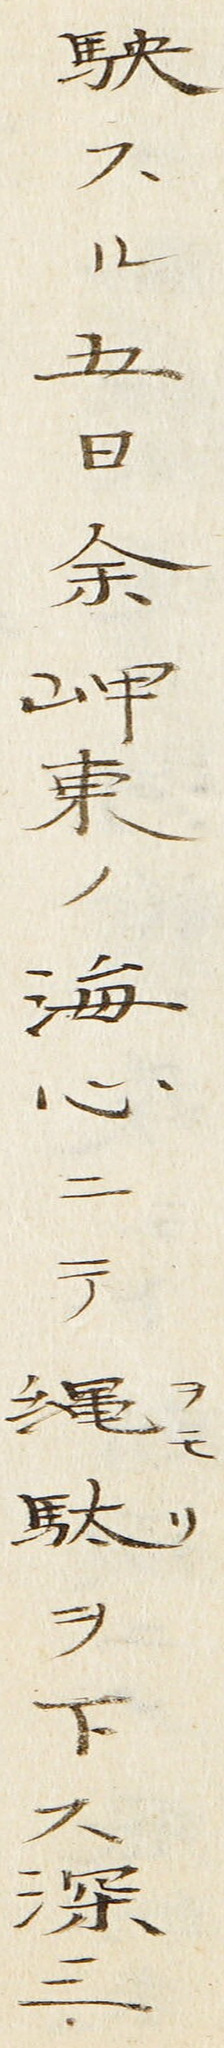駚スル五日余岬東ノ海心ニテ縄駄ヲ下ス深三
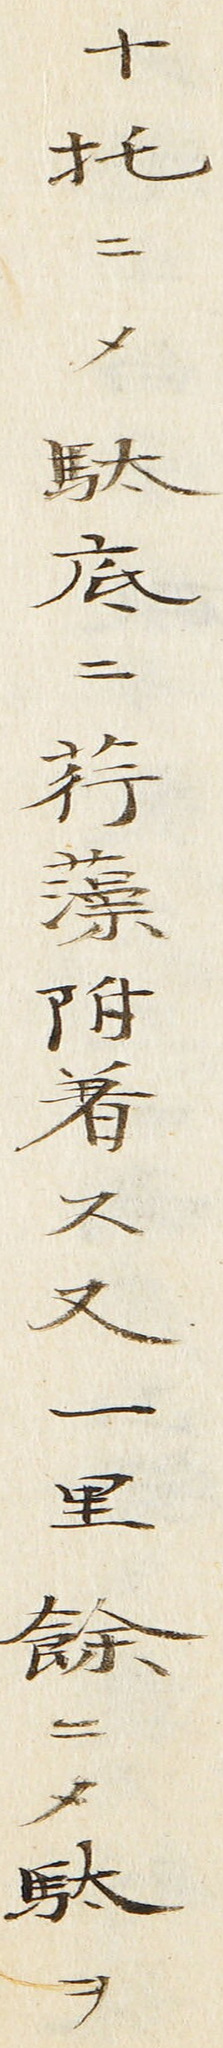十托ニシテ駄底ニ荇藻附着ス又一里余ニシテ駄ヲ
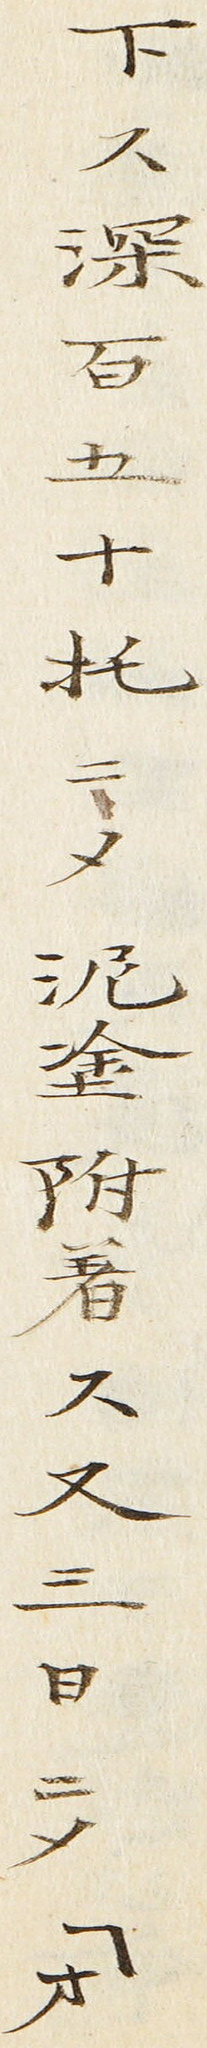下ス深百五十托ニシテ泥塗附着ス又三日ニシテ「オ
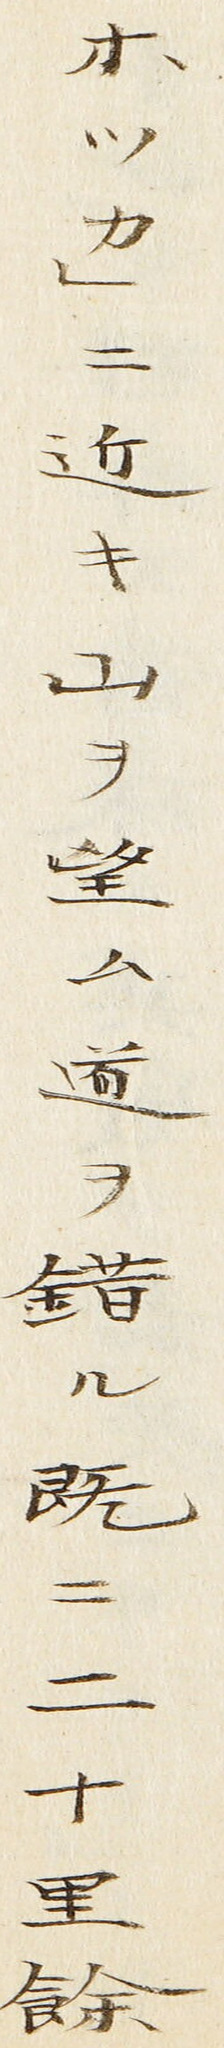ホツカ」ニ近キ山ヲ望ム道ヲ錯ル既ニ二十里余
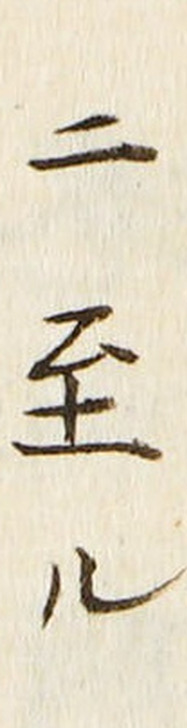ニ至ル
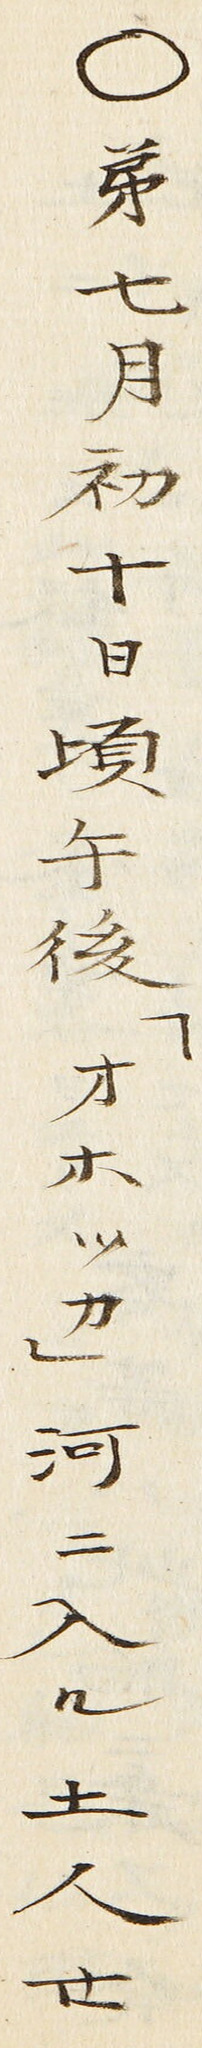○第七月初十日頃午後「オホツカ」河ニ入ル土人廿
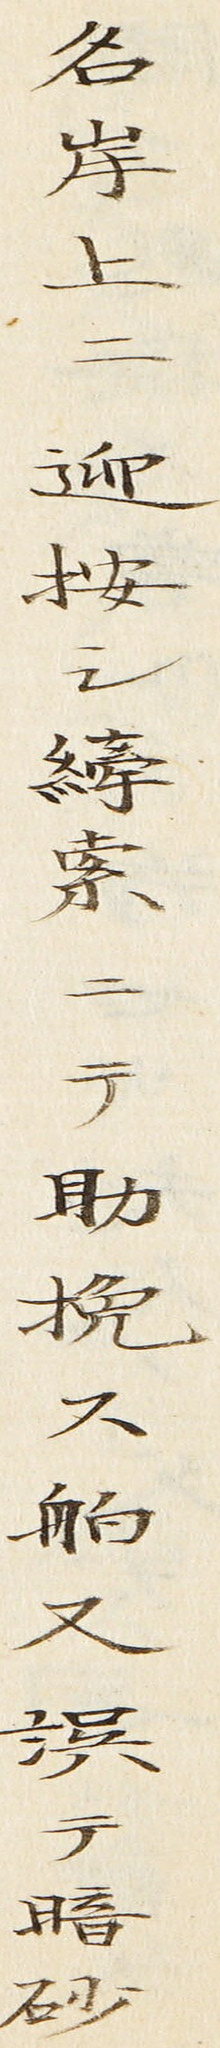名岸上ニ迎按シ縴索ニテ助挽ス舶又誤テ暗砂
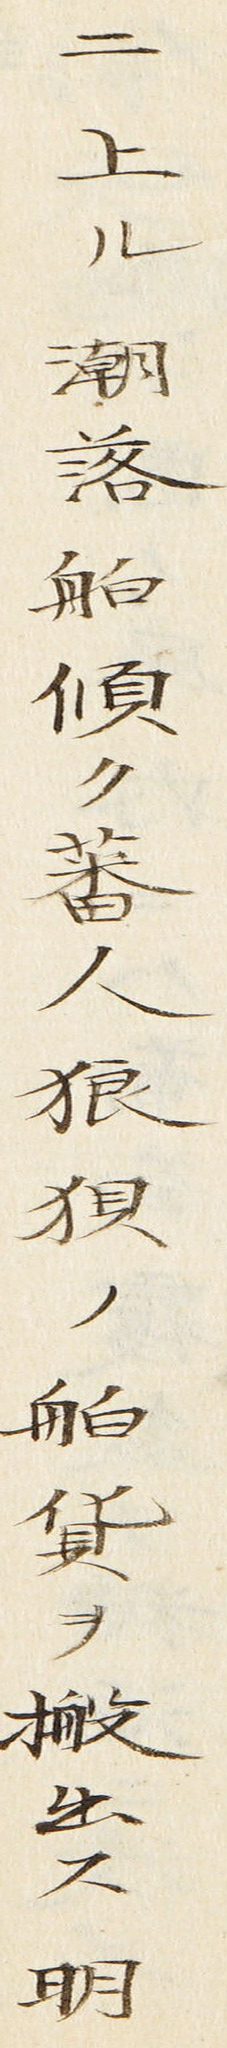ニ上ル潮落舶傾ク蕃人狼狽ノ舶貨ヲ搬出ス明
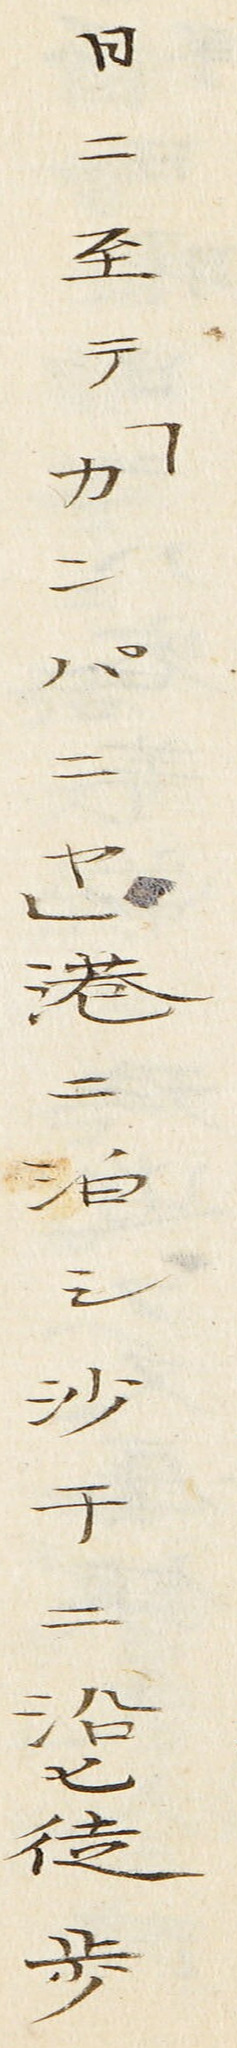日ニ至テ「カンパニヤ」港ニ泊シ沙干ニ沿ヒ徒歩
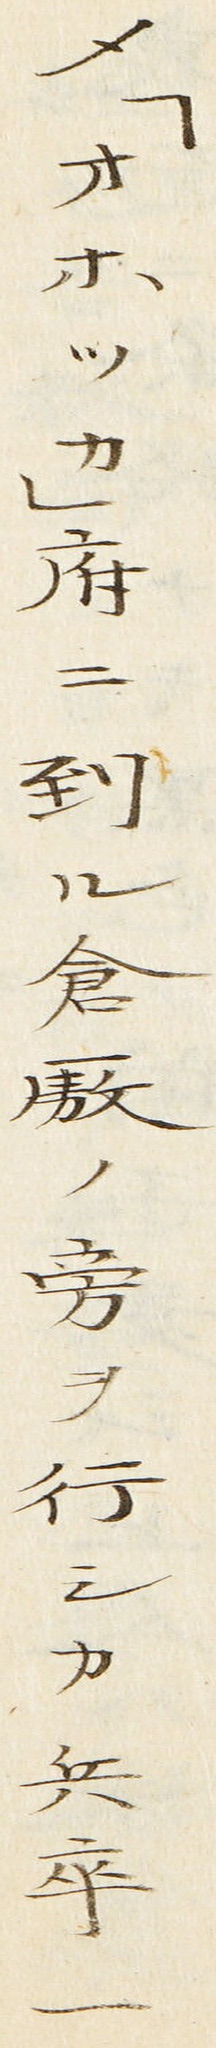シテ「オホツカ」府ニ至ル倉厫ノ旁ヲ行シカ兵卒一
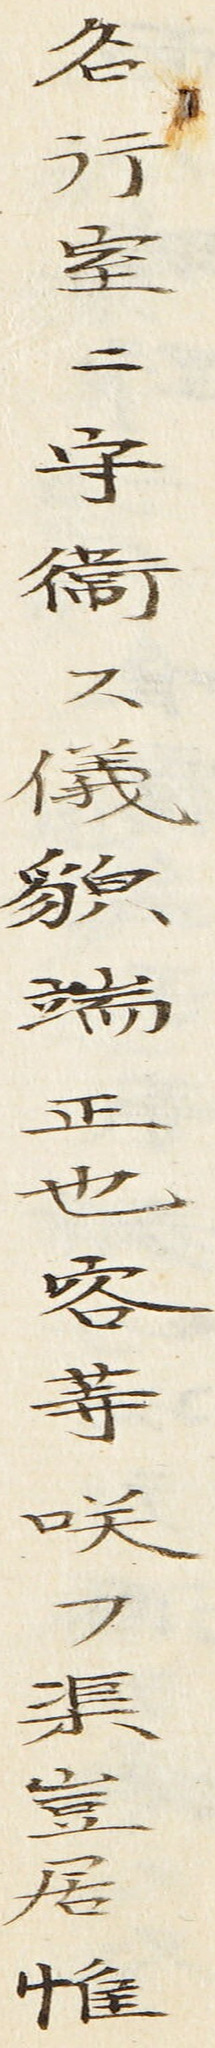名行室ニ守衛ス儀貌端正也客等咲フ豈居惟
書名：流蕃通書
